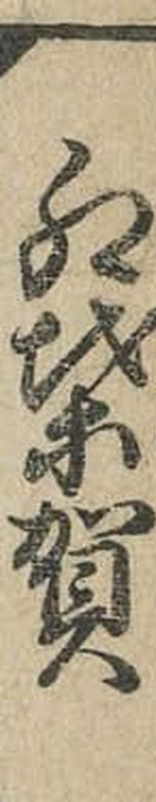紅葉賀
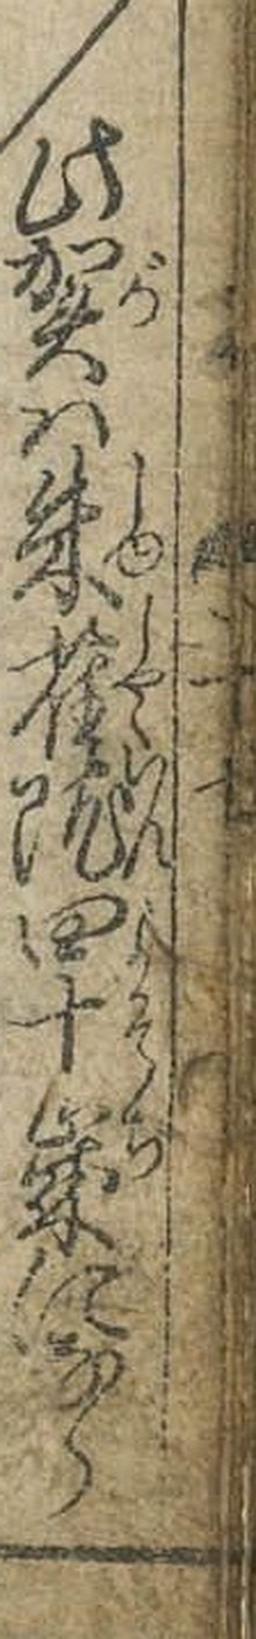此賀は朱雀院四十歳になら
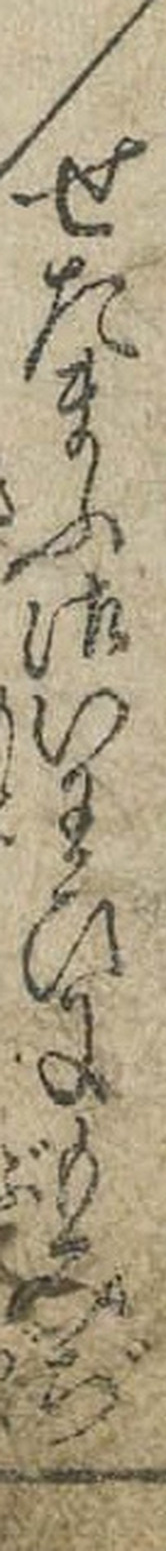せたまふ御いわひにもみぢ
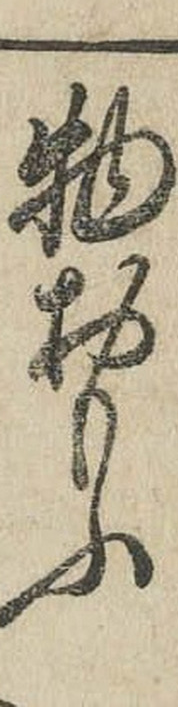物おもふ
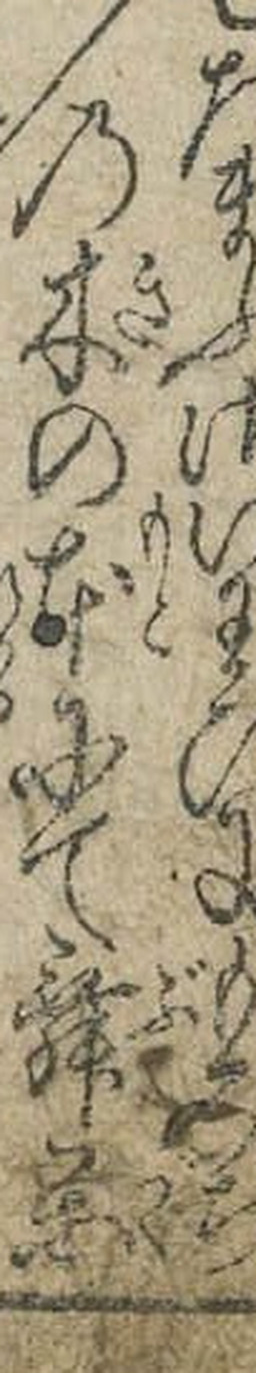の木の本にて舞楽
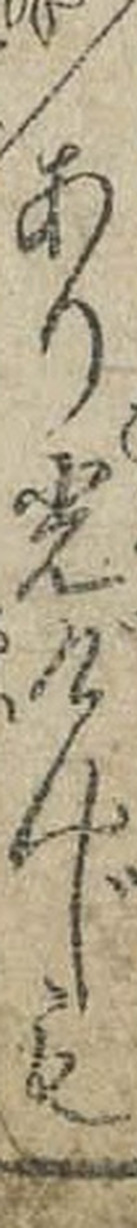あり光げんじも
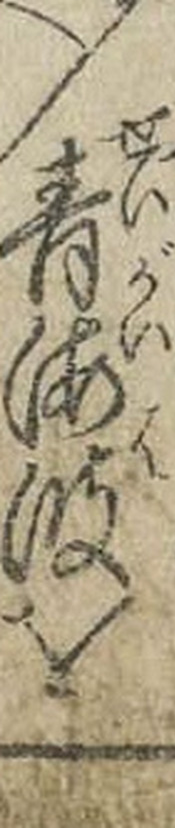青海波を
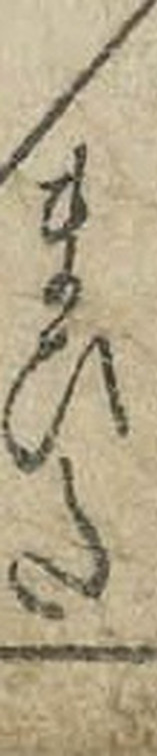まひた
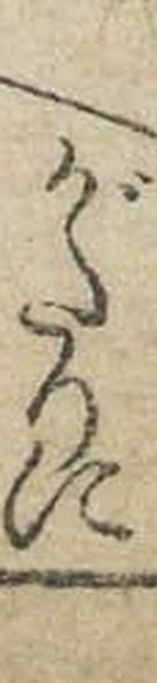がたりに
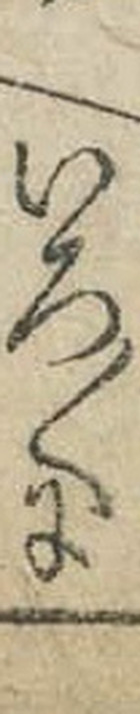いろ〳〵に
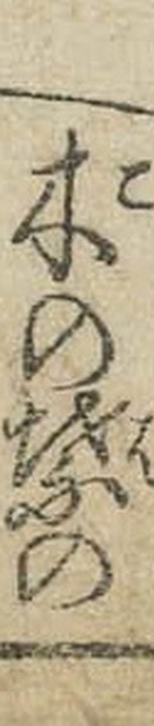木の葉の
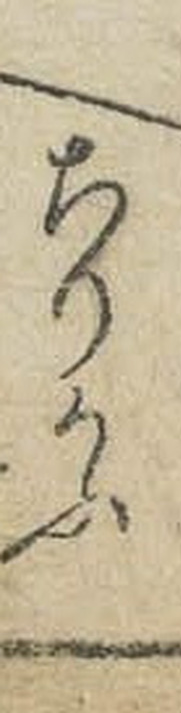ちりかふ
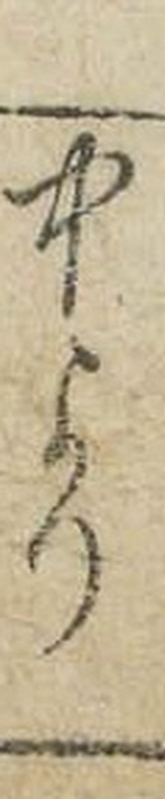中より
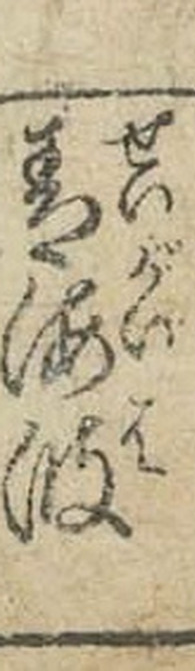青海波
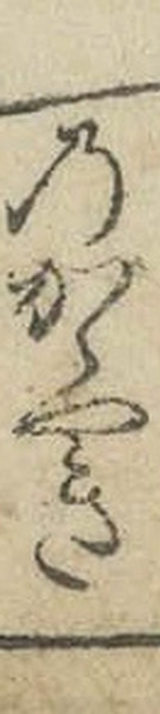のかゝやき
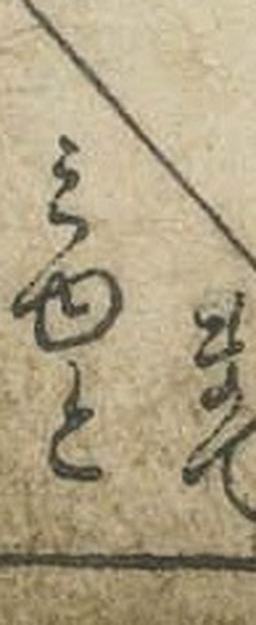みゆと
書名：絵本写宝袋 9巻 1之巻
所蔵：東京学芸大学教育コンテンツアーカイブ
